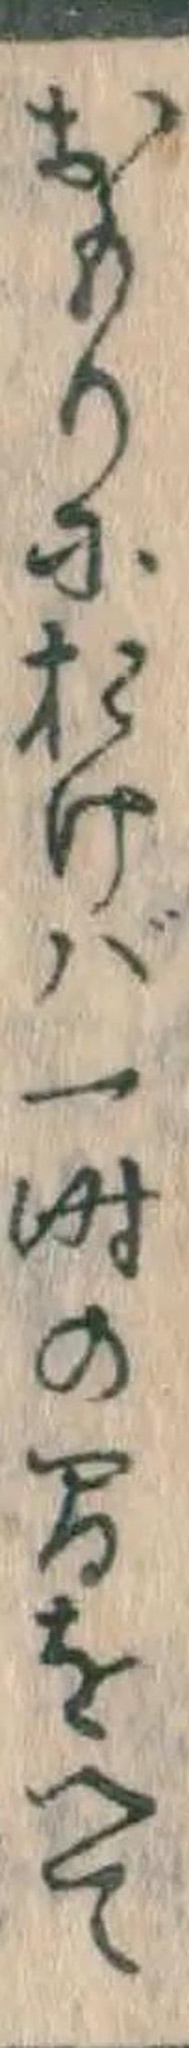おもりにおけば一時の間をへて
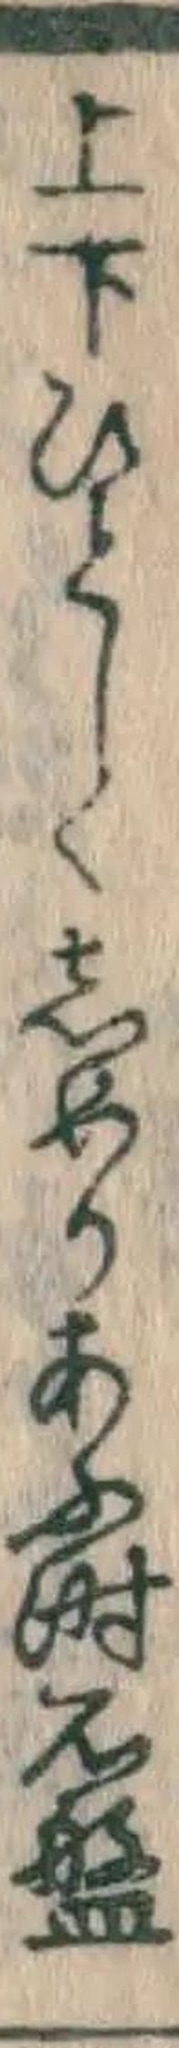上下ひとしくしめりあふ時石盤
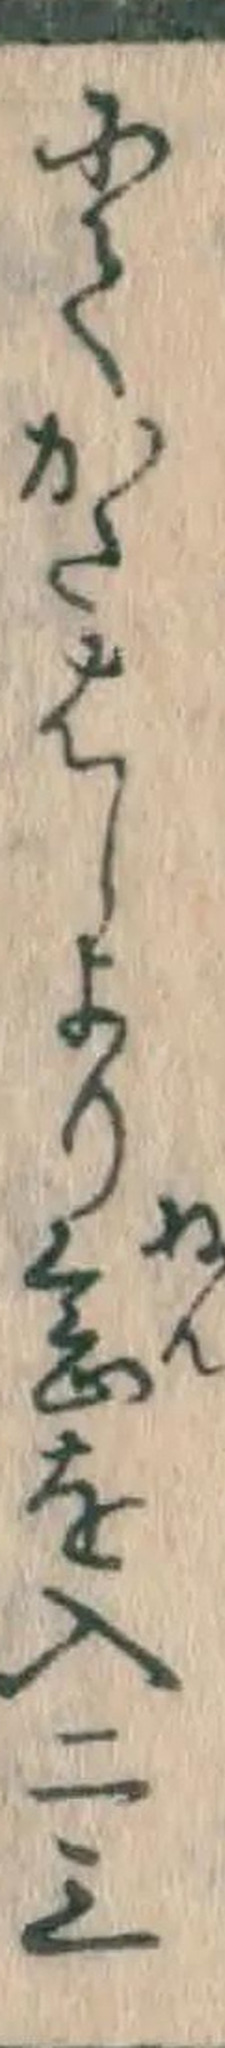にてかたはしより念を入二三
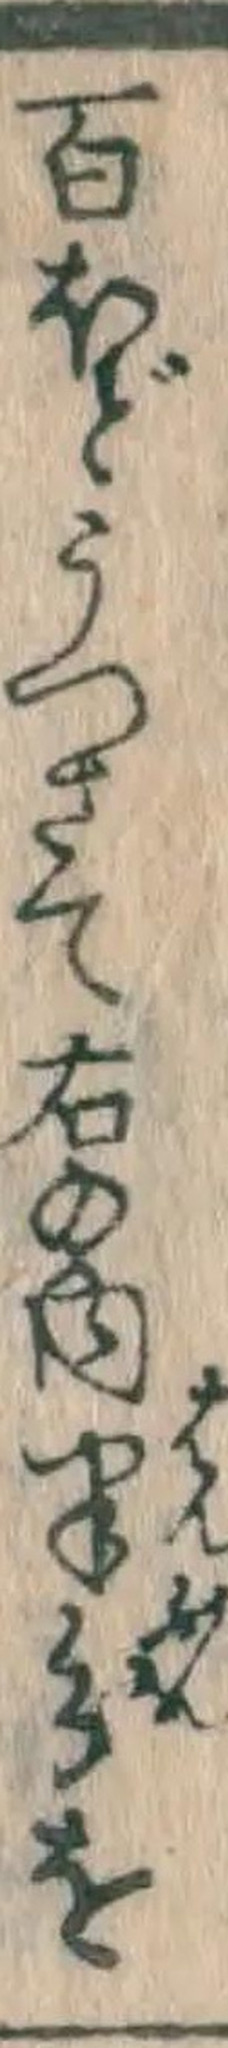百ほどうつさて右の内半分を
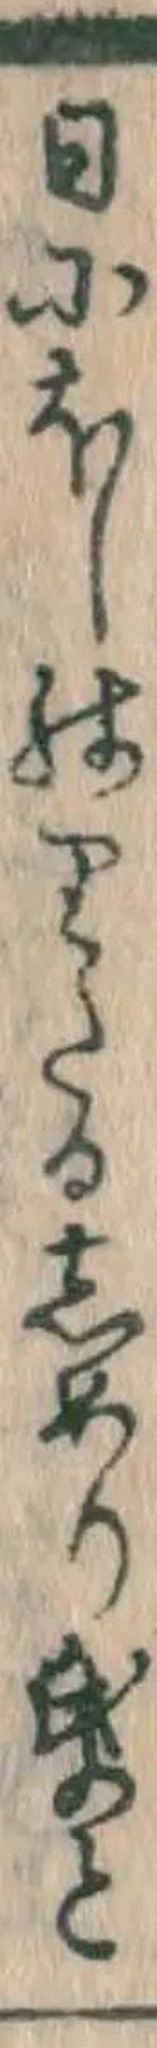日にほし残りたるしめり紙と

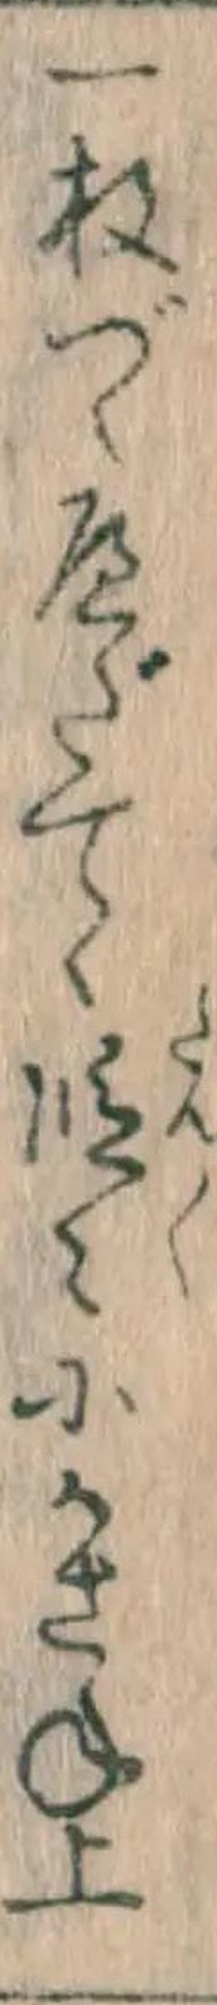一枚づゝへだてゝ段々にかさね上
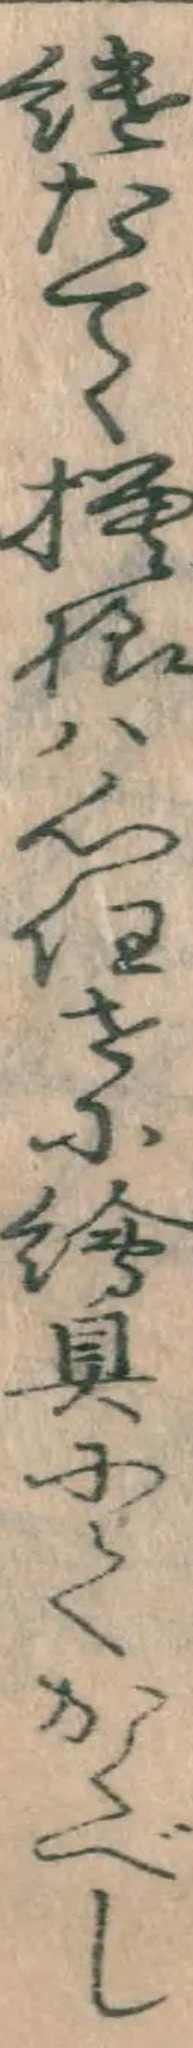継たてゝ摸様は心任せに絵具にてかくべし
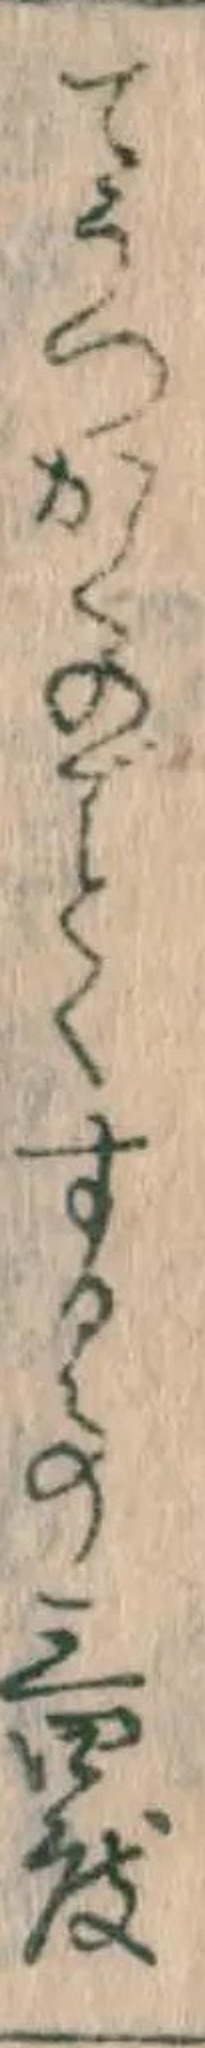てうつかくのごとくする事三四度
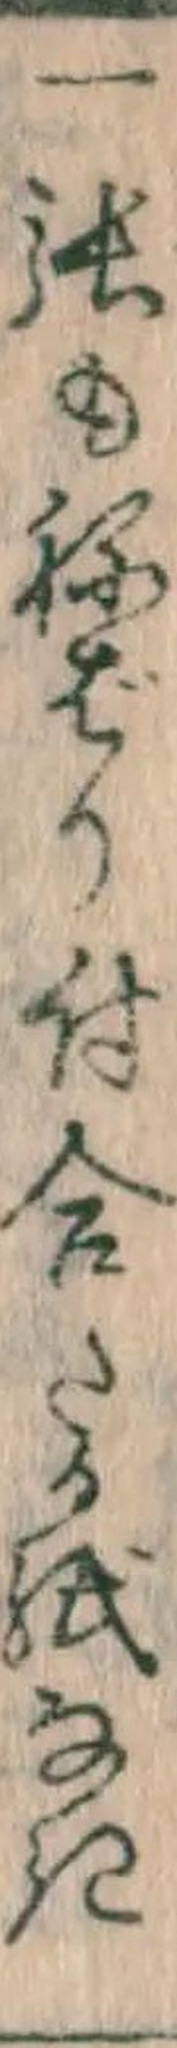一張もねばり付合たる紙なき
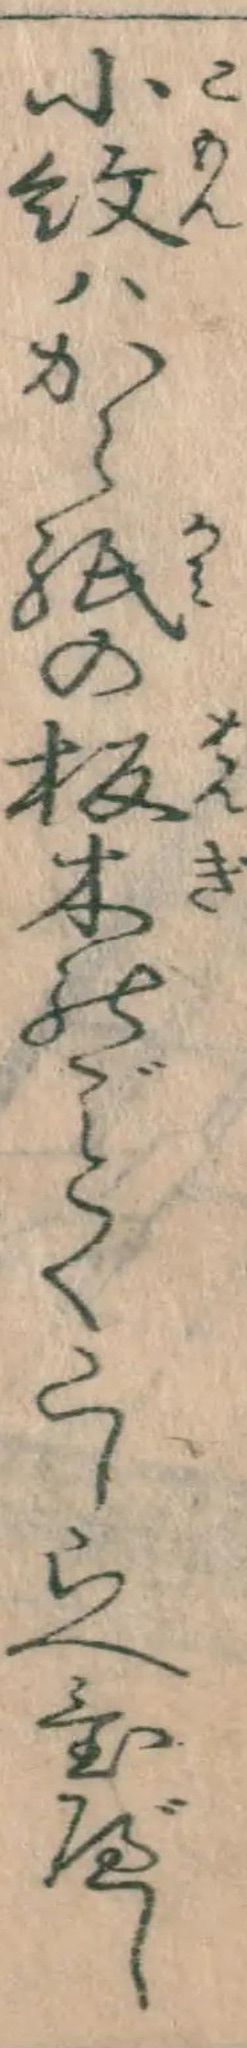小紋はから紙の板木のごとくこしらへ置べし
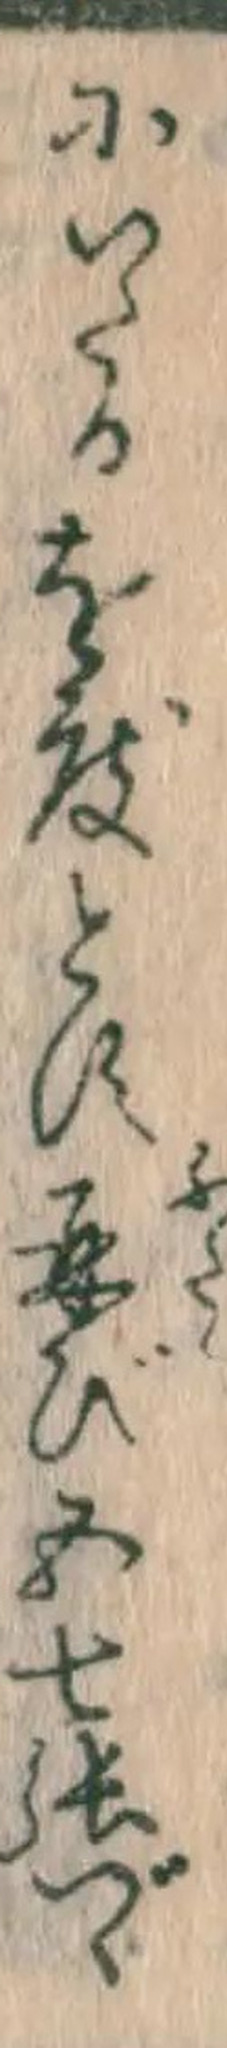にいたるを度とす再び五七張づゝ
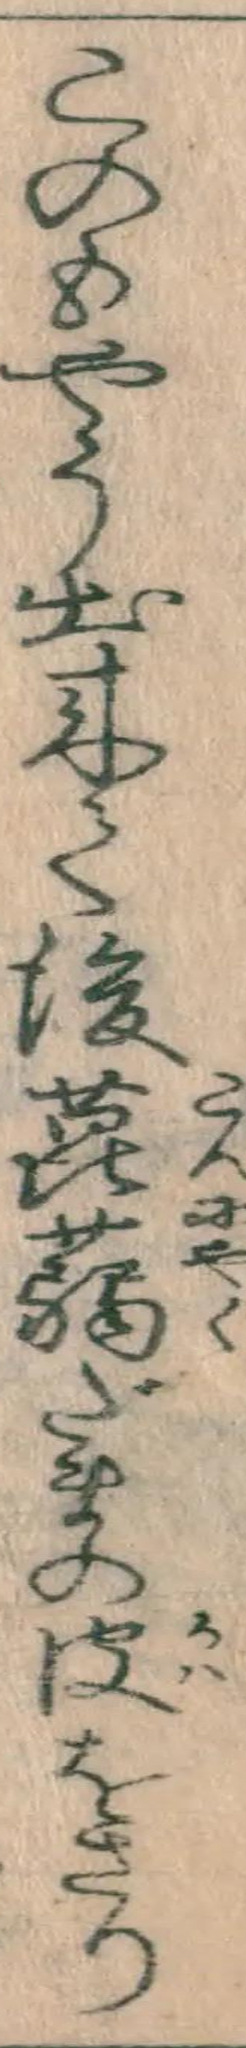このもやう出来て後菎蒻だまの皮をさり
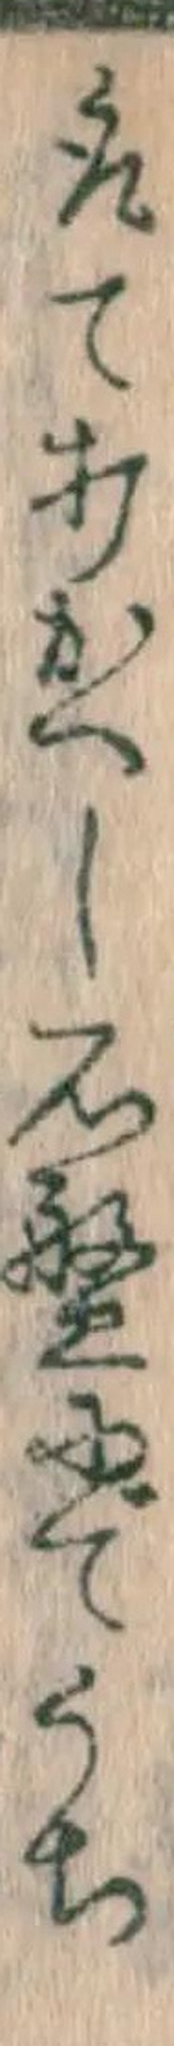取て打かへし石盤にてうち
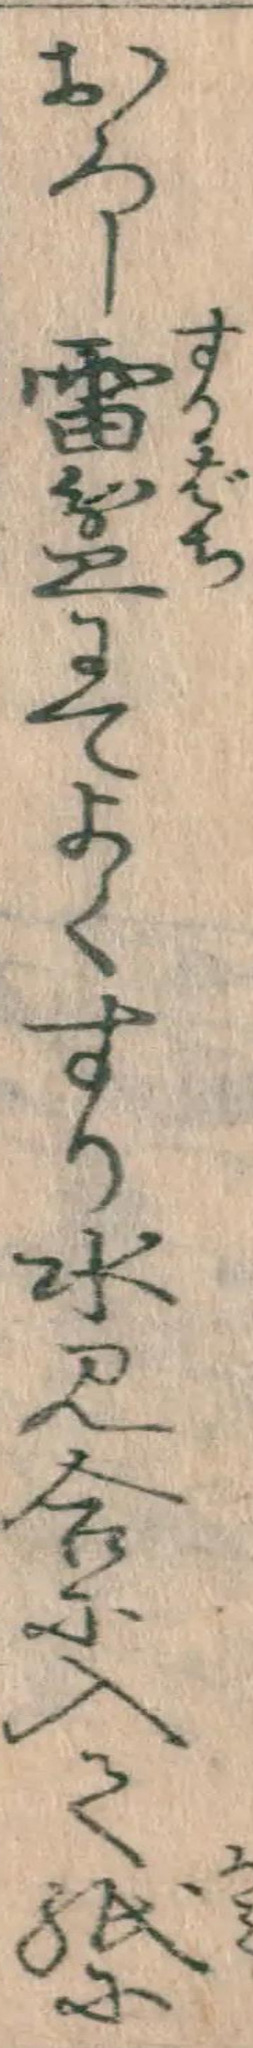おろし雷盆にてよくすり水見合に入て紙に
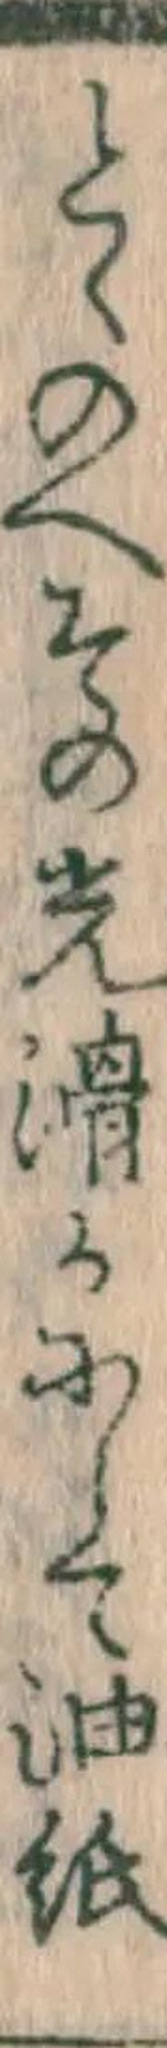とゝのへその光滑かにして油紙
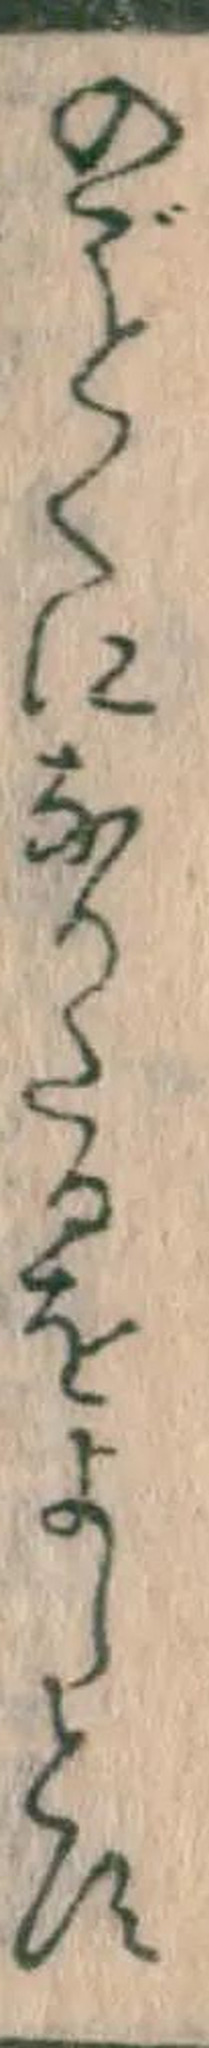のごとくになりたるをよしとす
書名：広益秘事大全 3巻. [2]
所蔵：国立国会図書館 National Diet Library, JAPAN
